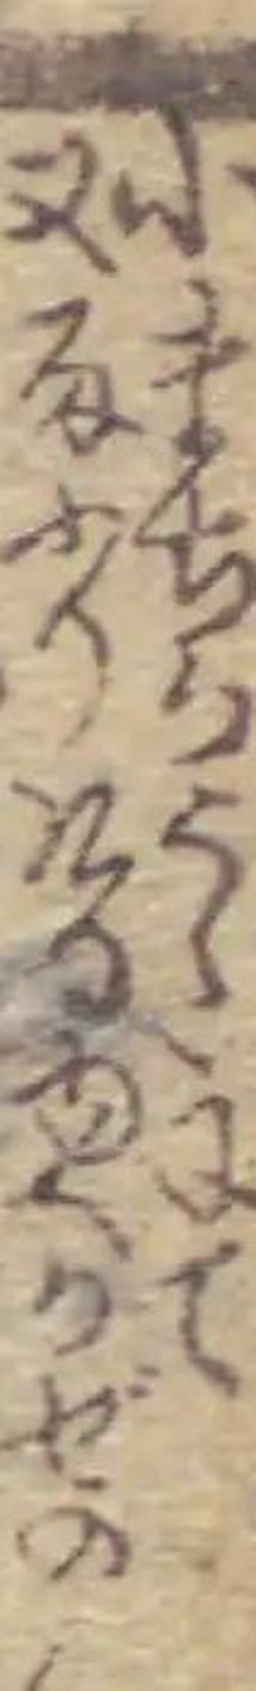又雨ふりけるゆへかぜの
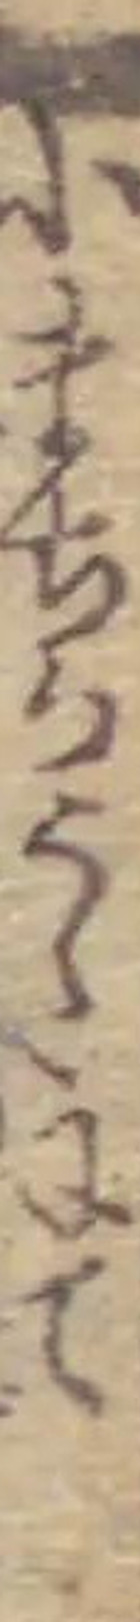小まちかうたにて
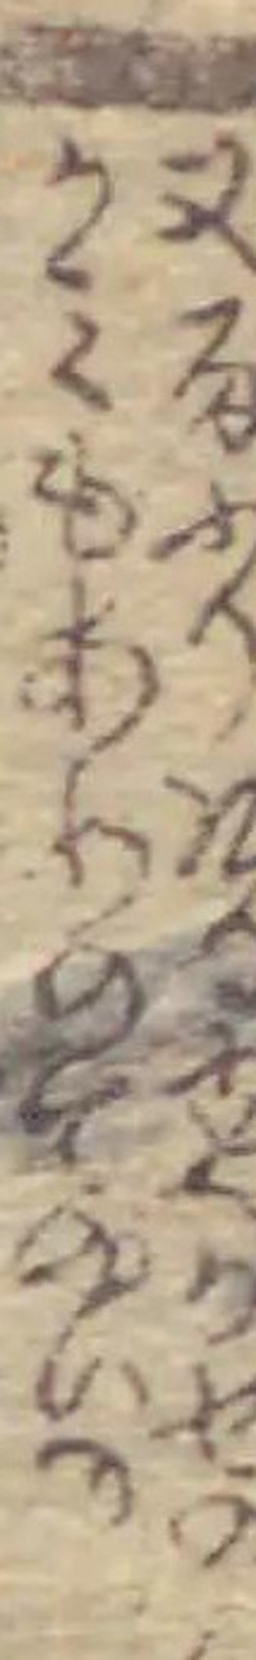かみもあめのてやいの
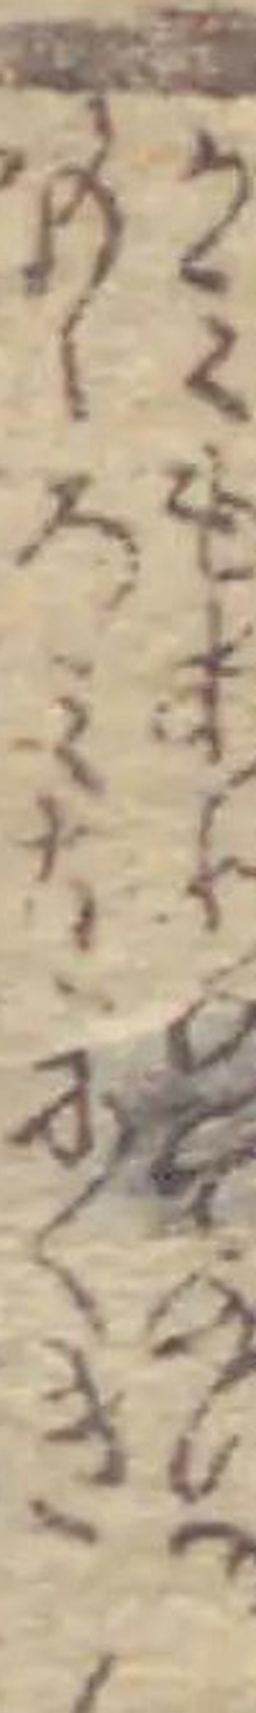もくろみをにくき
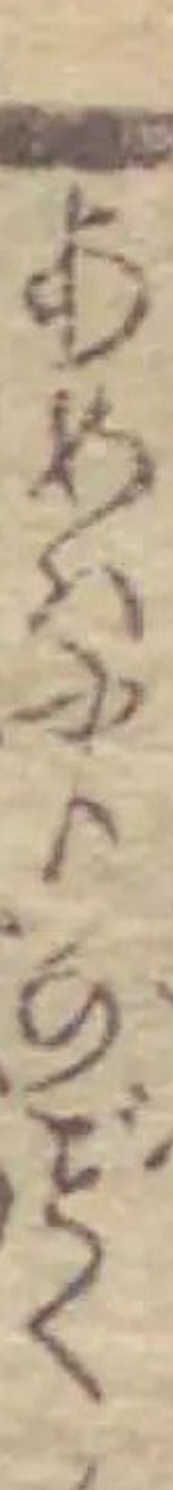あめはやりのごとく
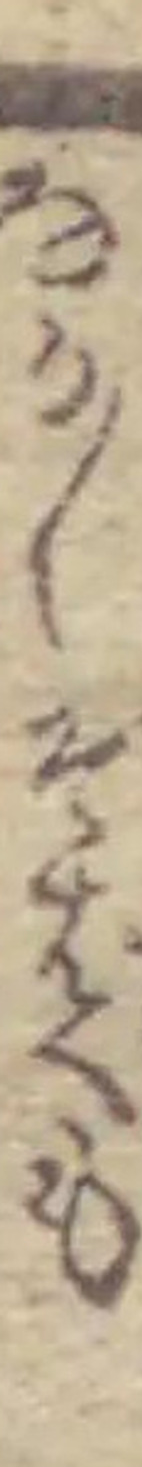なか〳〵そばへも
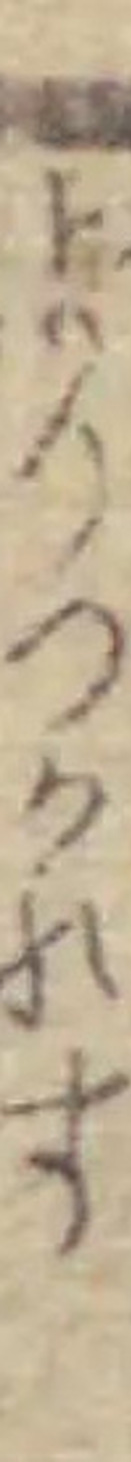よりつかれす
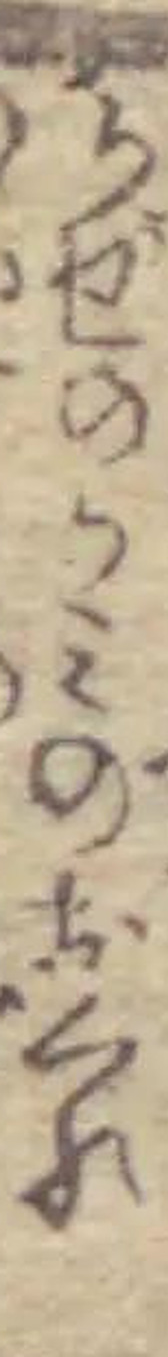かぜのかみのおくれ
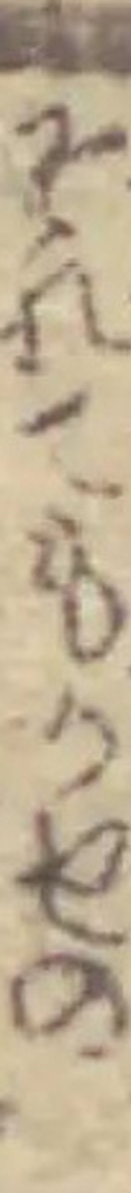それてもかせの
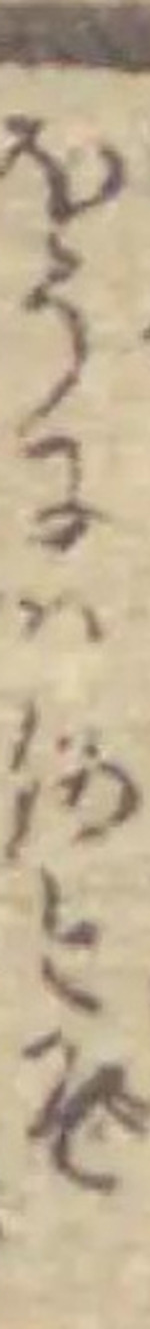ほうには何とぞ
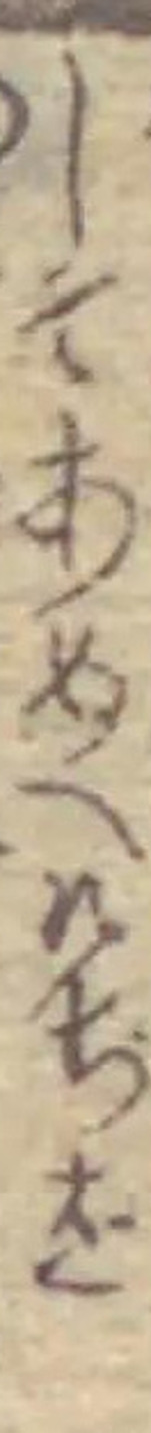してあめへけちを
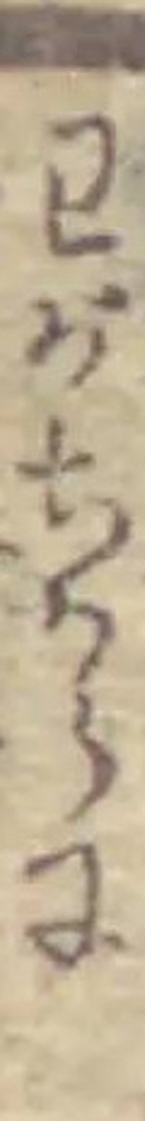わがちからに
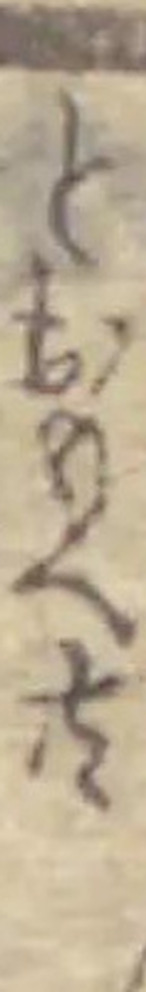とおもへ共
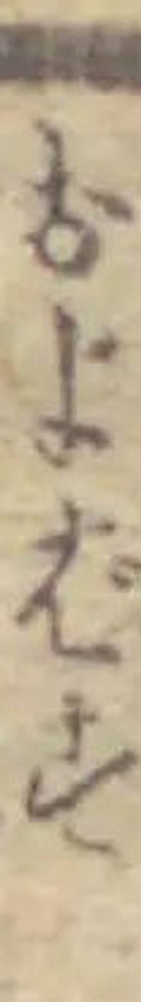およばす
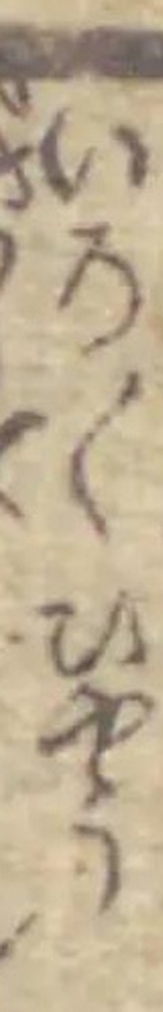いろ〳〵ひやう
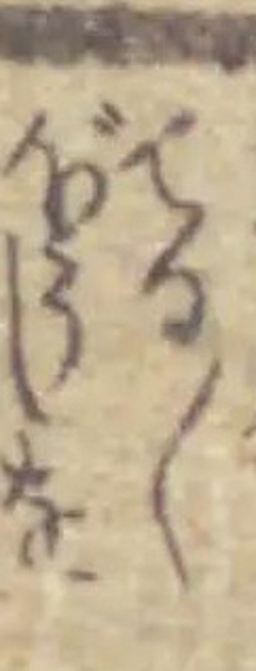ぼうしを
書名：雨宮風宮出儘略縁記 3巻
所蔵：国立国会図書館 National Diet Library, JAPAN
